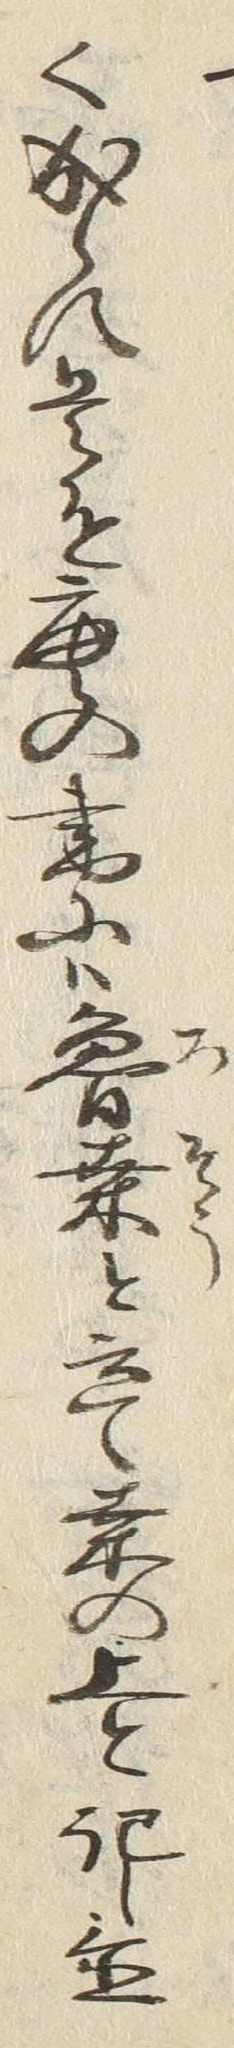く成ら須是を唐の書尓は魯桑と云て桑の上と記し置
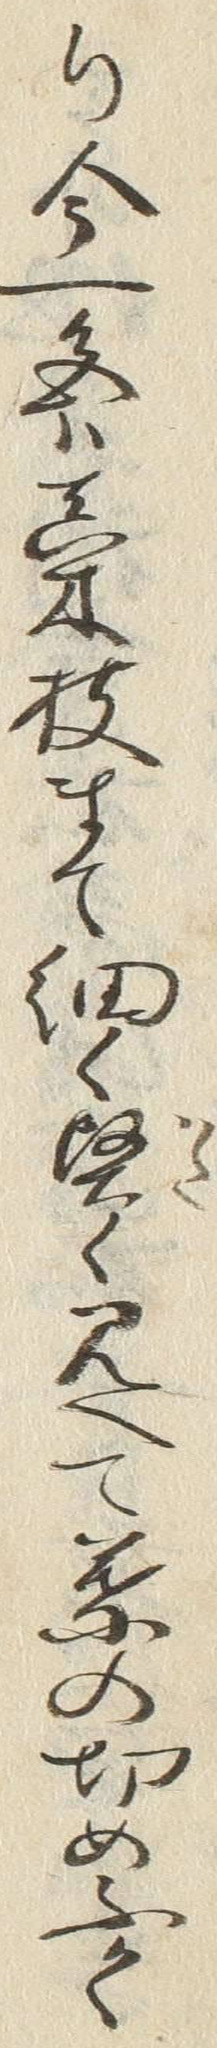り今一色は真木枝まて細く堅く見へて葉の切めふかく
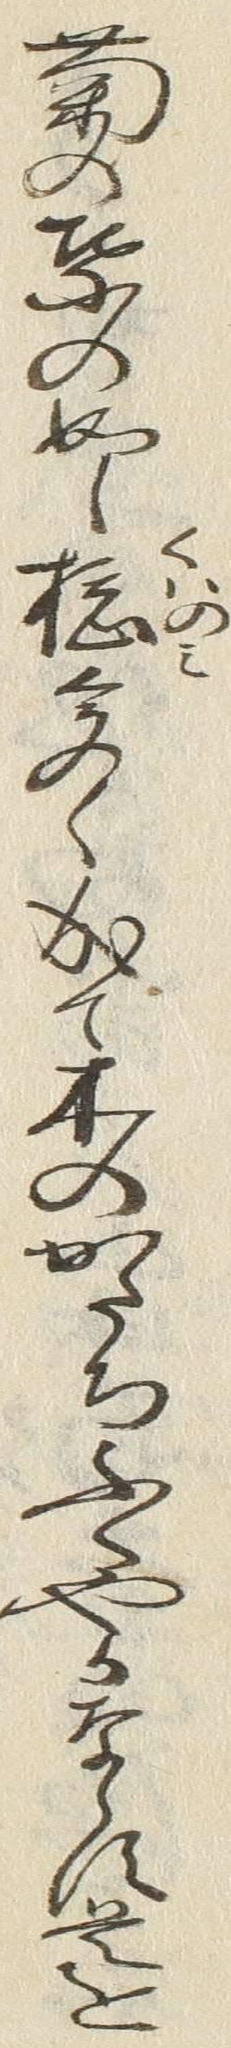菊の葉の如し椹多く成て木のかたちふくやかなら須是を
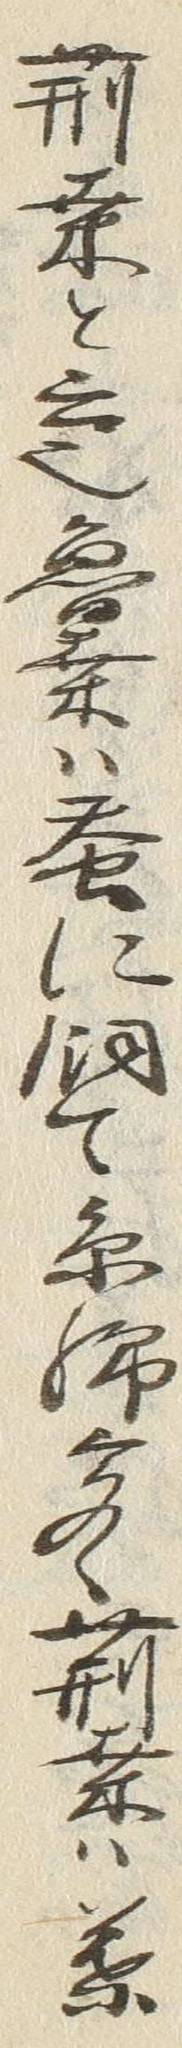荊桑と云也魯桑は蚕に飼て糸綿多く荊桑は葉
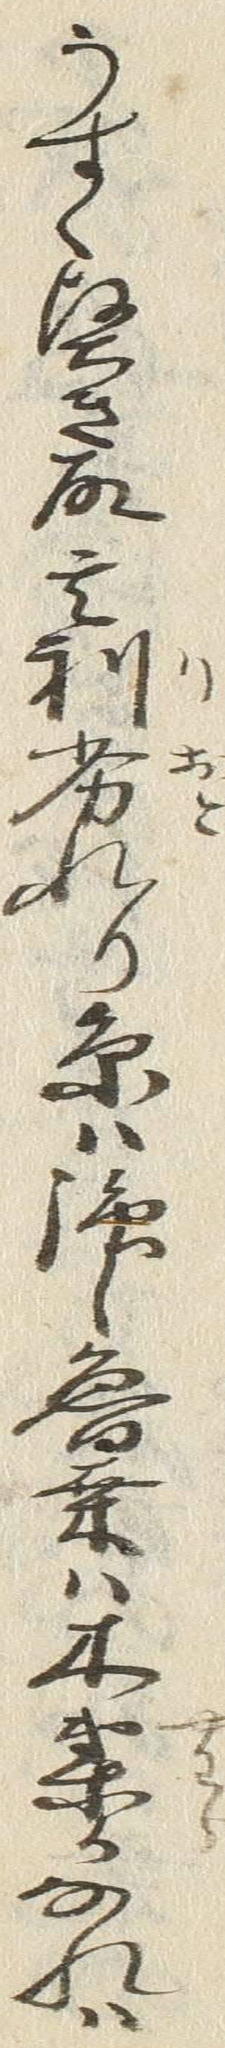うすく堅き故其利劣れり糸は強し魯桑は木柔かなれは
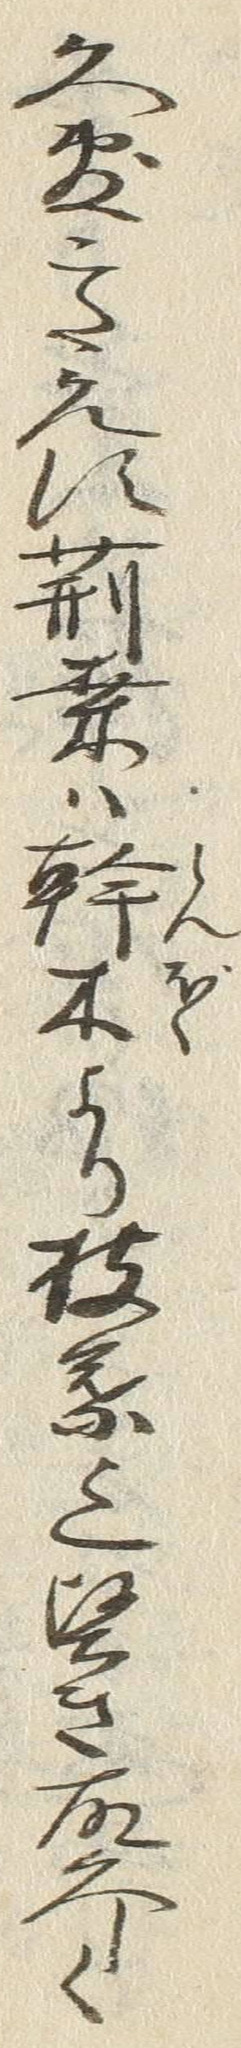久敷こたえ須荊桑は幹木より枝葉迄堅き故久しく
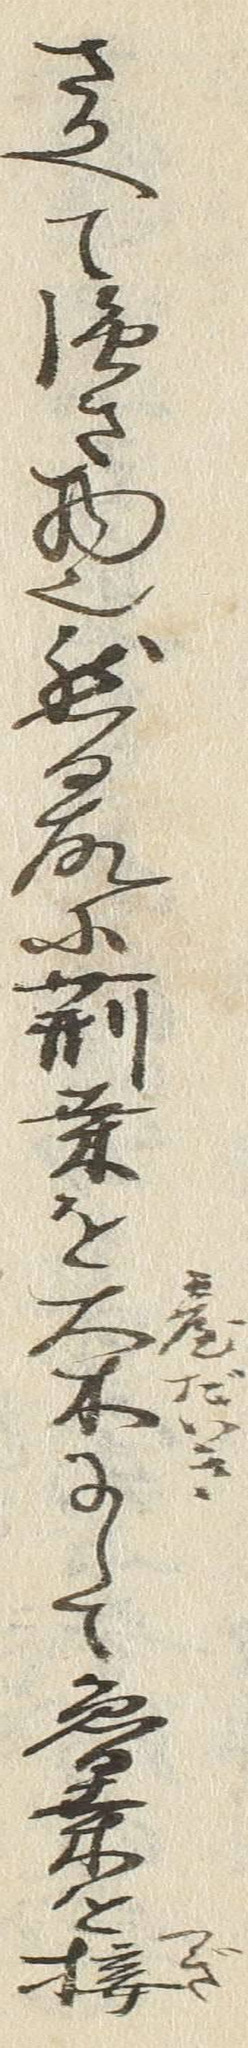さかへて強き物也然る故尓荊桑を大木尓して魯桑を接
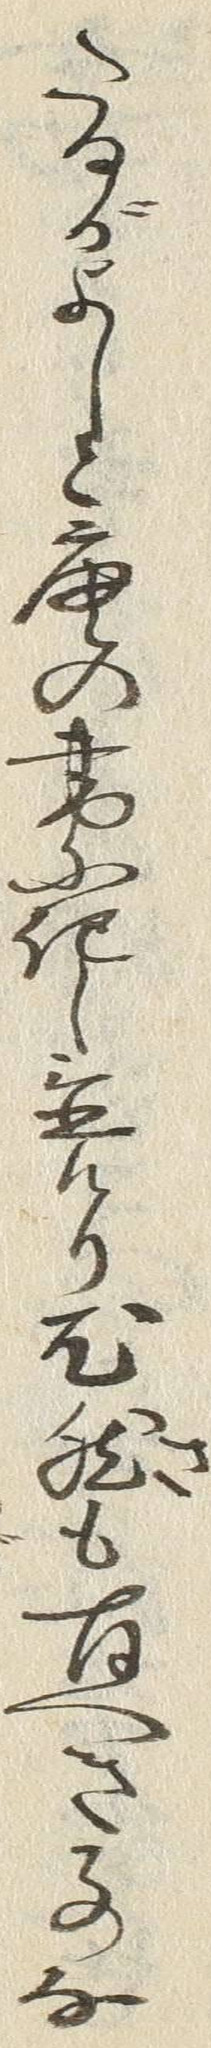たるがよしと唐の書尓記し置けり尤然も有へき事な
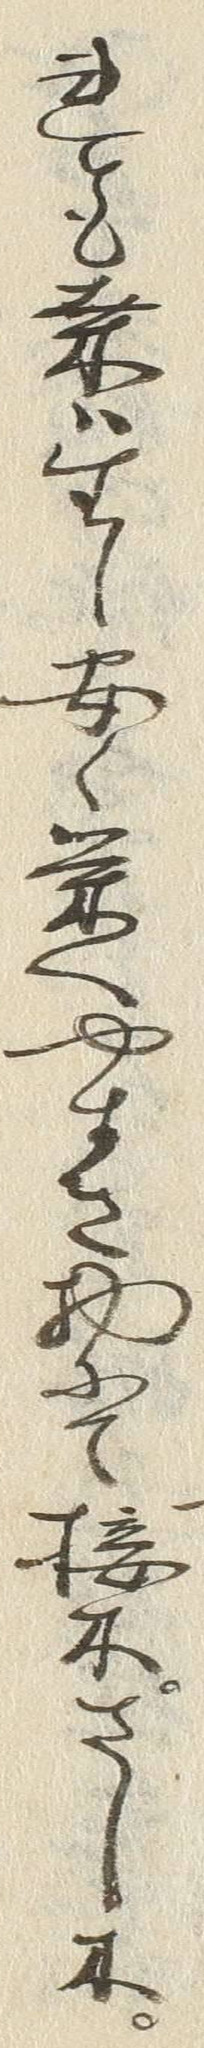連とも桑は生し安く菜へやすき物尓て接木。さし木。
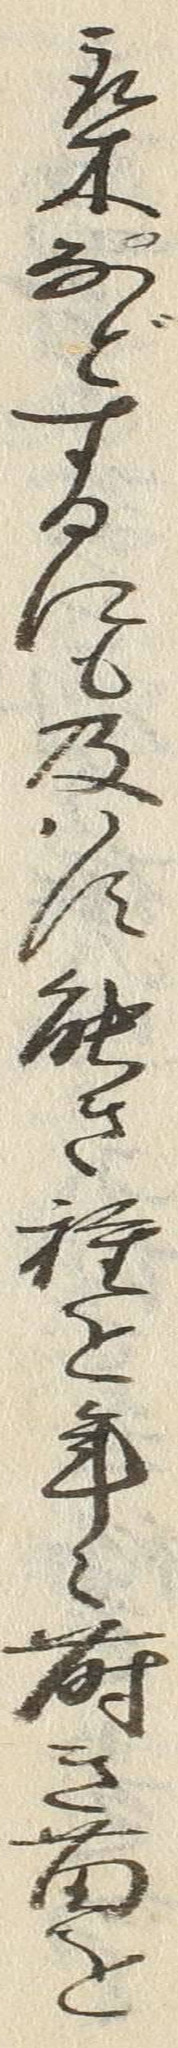取木。などするにも及は須能き種を年々蒔き苗を
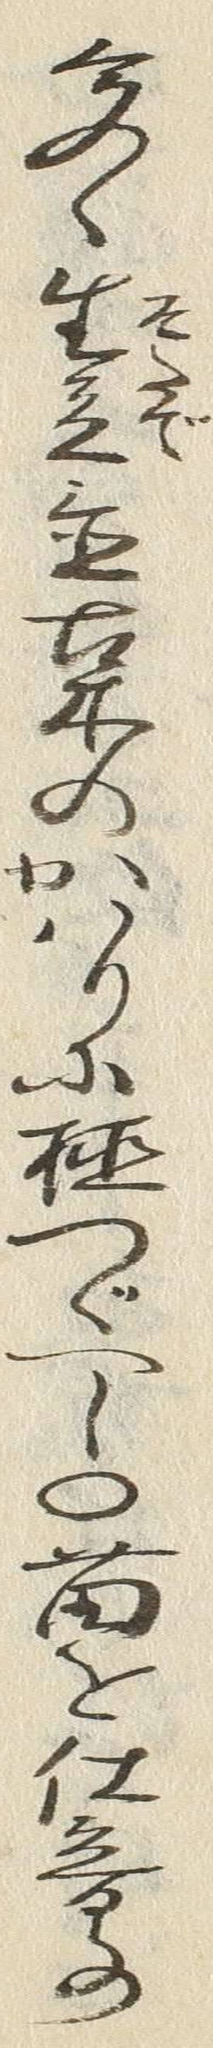多く生立置古木のかはり尓植つぐへし〇苗を仕立る事
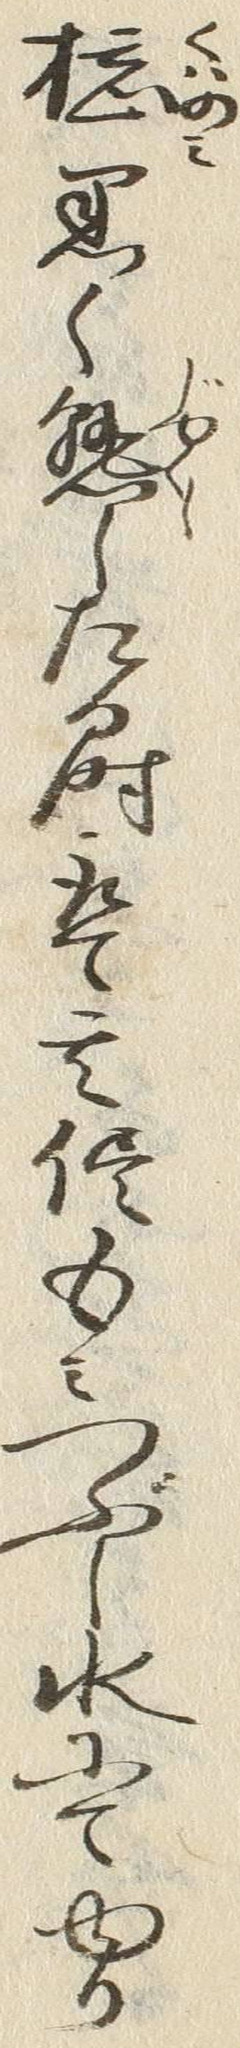椹黒く熟したる時取て其侭もみつぶし水尓てゆり
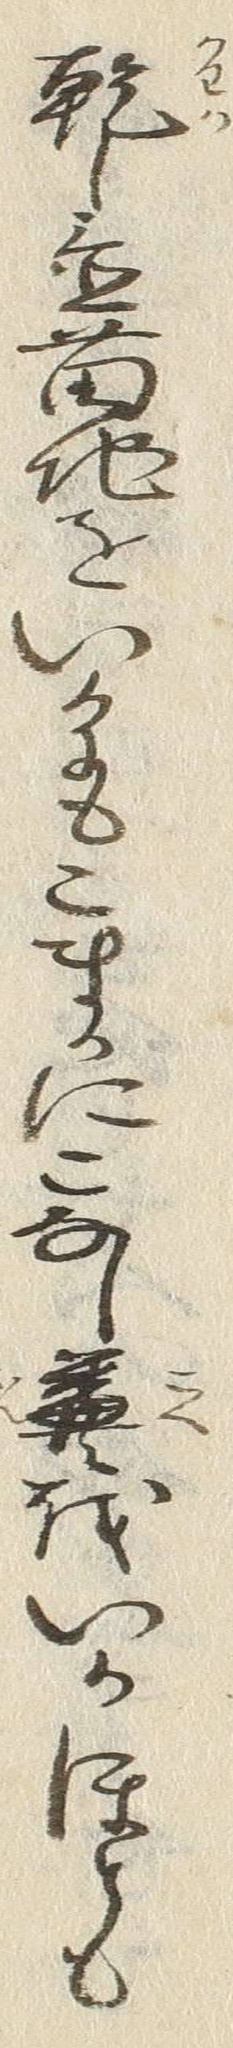乾し置苗地をいか尓もこまかにこなし糞越いかほとも
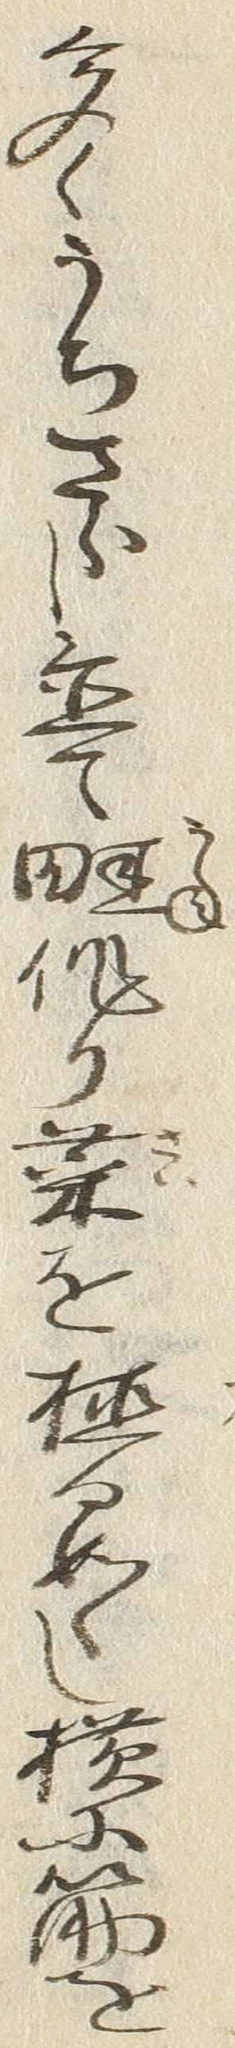多くうちさらし置て畦作り菜を植る如くし横尓筋を
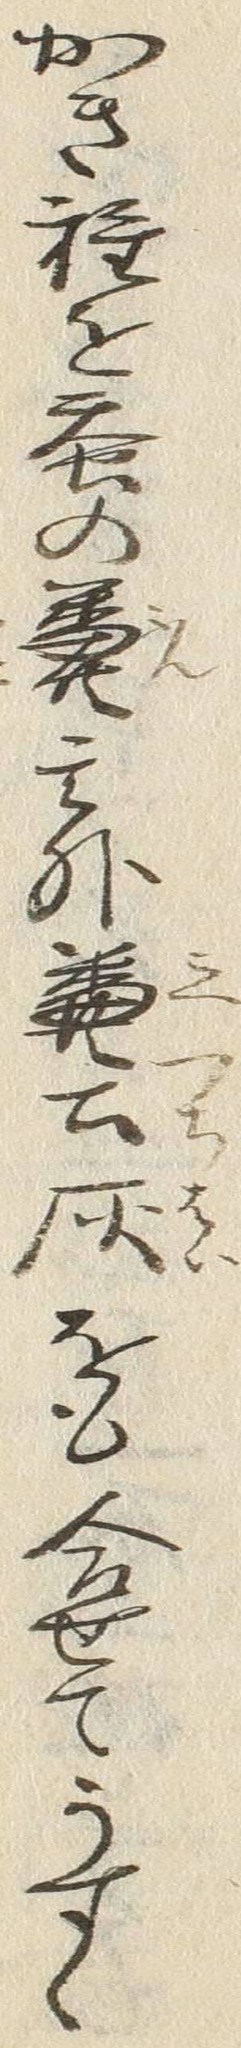かき種を蚕の糞其外糞土灰をも合せてうすく
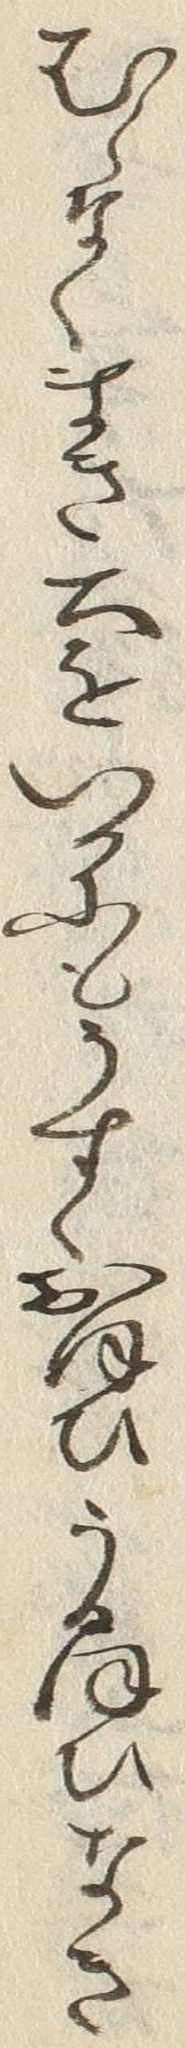むらなくまき土をいか尓もうすくおほひうるほひなき
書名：養蠶實驗録後編
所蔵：東京大学農学生命科学図書館 国文学研究資料館
